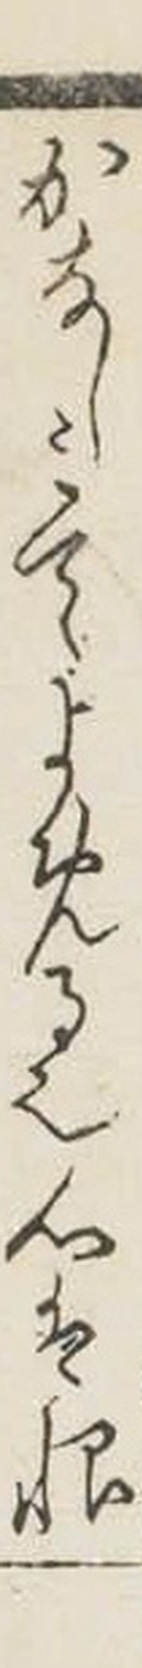かなしみてよめる也心は恨
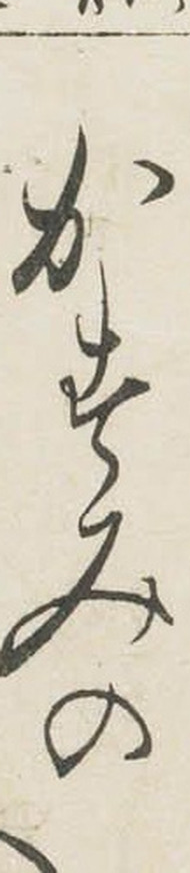かすみの
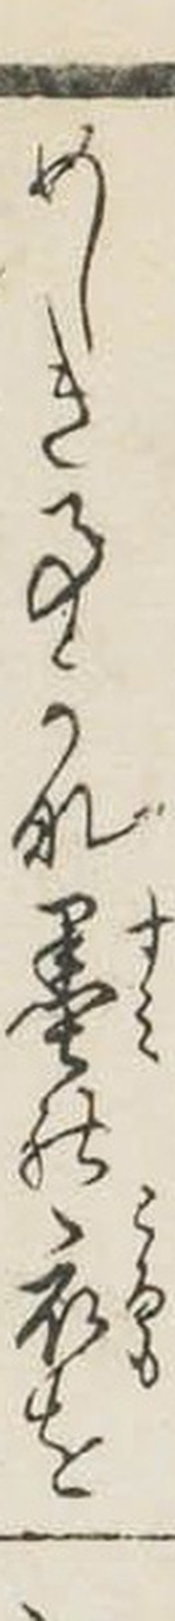めしき事かな墨の衣を
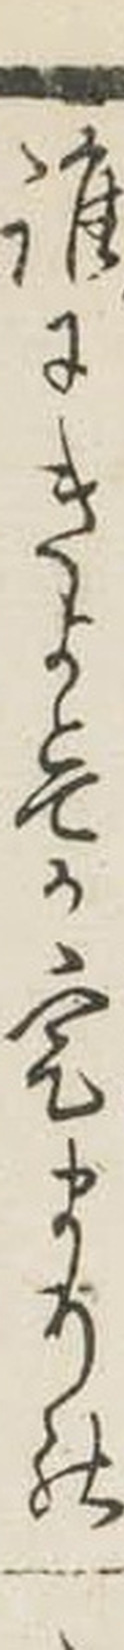誰にきよとてか定まりの
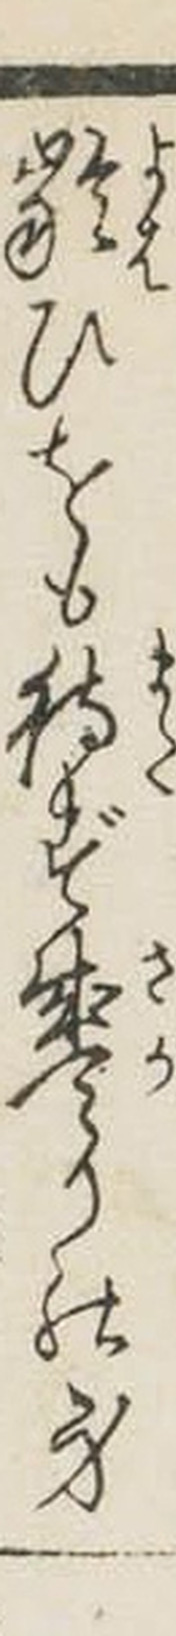齢ひをも待ず盛りの身
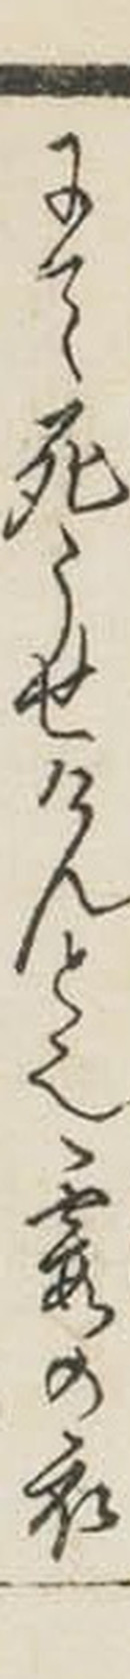にて死うせけんと也霞の衣
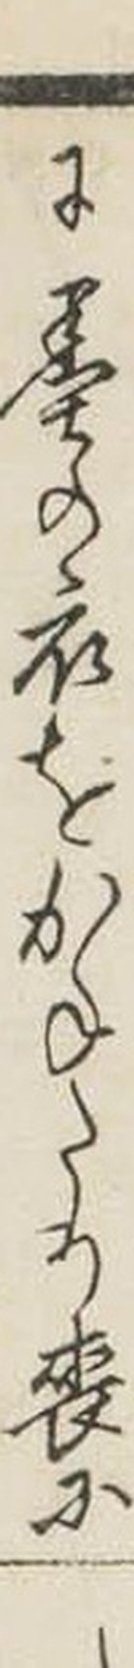に墨の衣をかねたり喪に
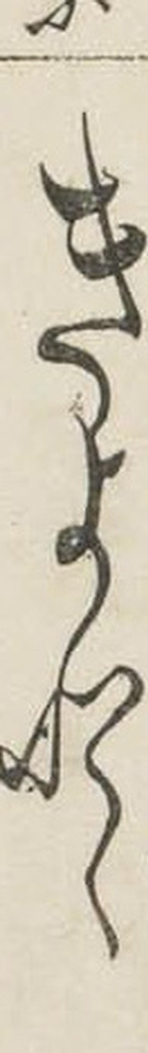きよと
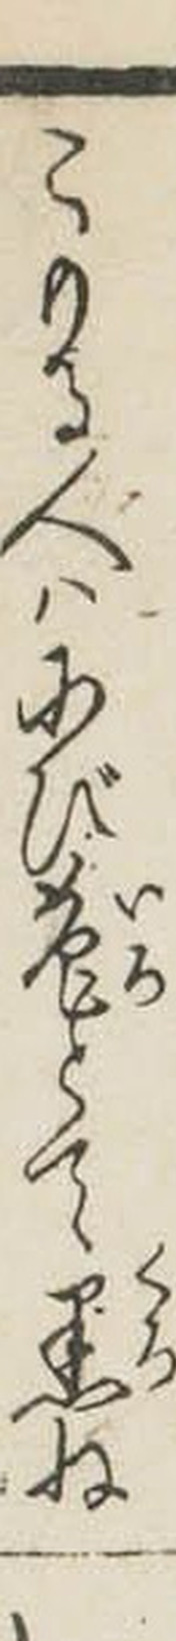こもる人はにび色とて黒ね
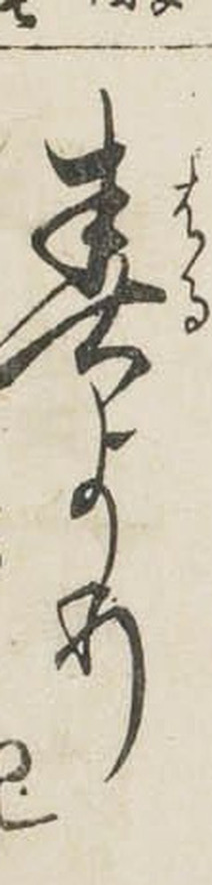春より
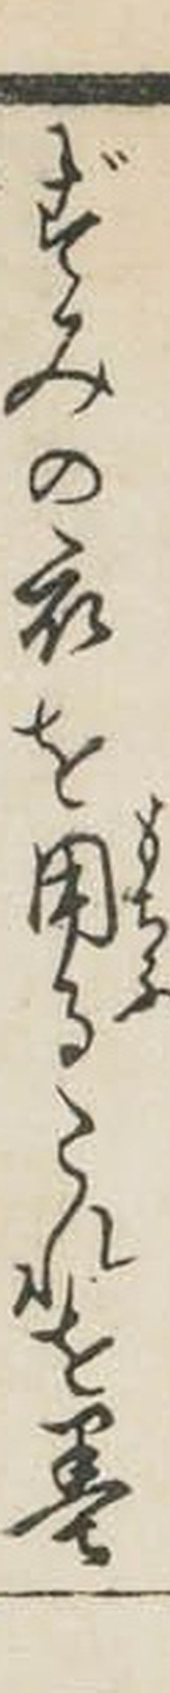ずみの衣を用るこれを墨
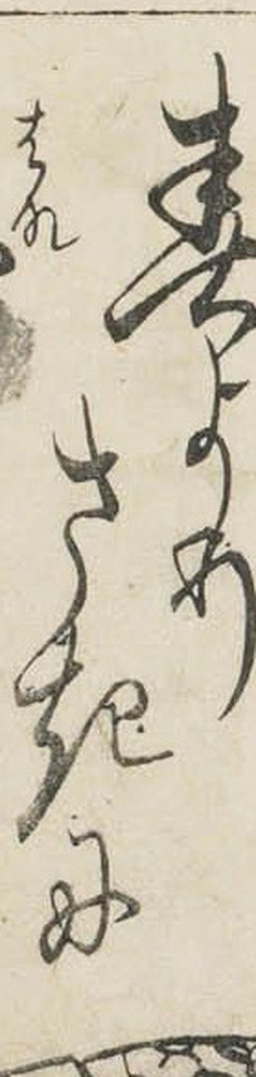さきに
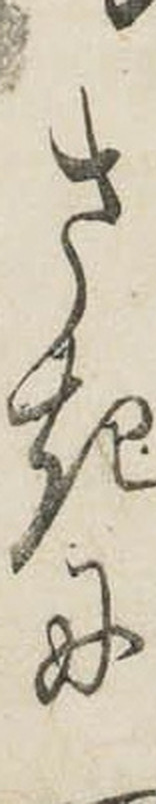さきに
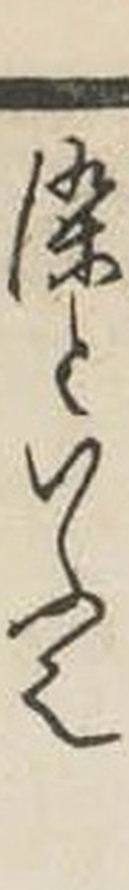染といふ也

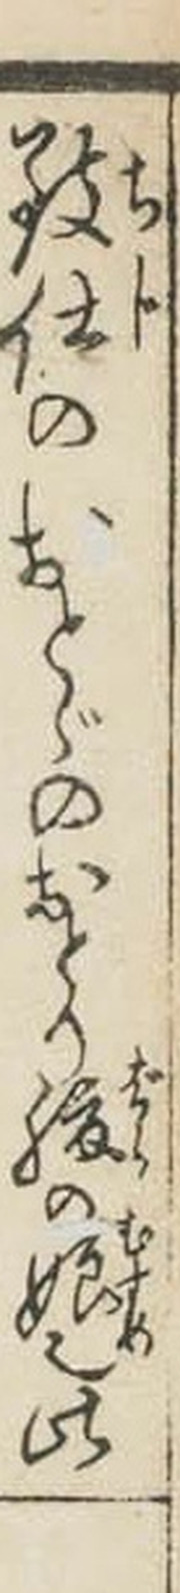致仕のおとゞのおとり腹の娘也此
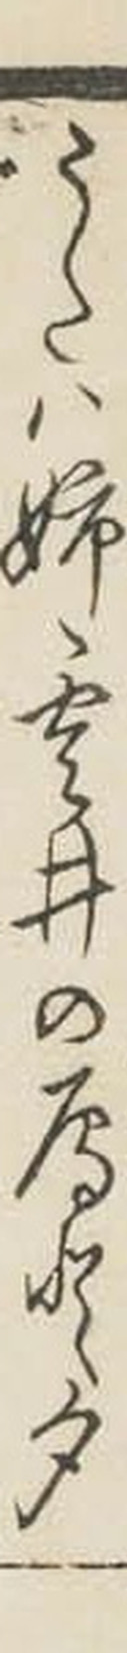うたは姉雲井の鳫と夕
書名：源氏百人一首
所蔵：東京学芸大学教育コンテンツアーカイブ
